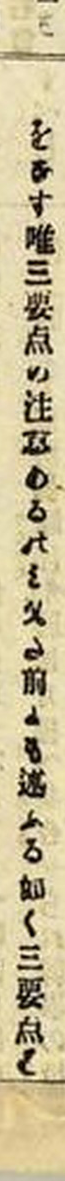をなす唯三要点の注意あるのみ又た前にも述ふる如く三要点は
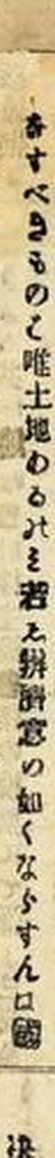なすべきものは唯土地あるのみ若し弁辞意の如くならすんは国
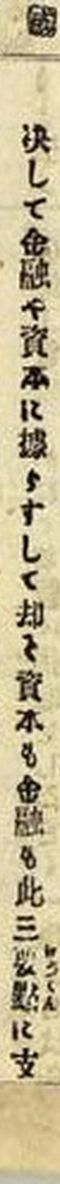決して金融や資本に拠らすして却て資本も金融も此三要点に支
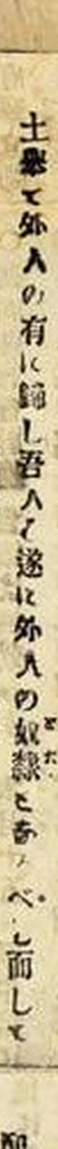土挙て外人の有に帰し吾人は遂に外人の奴隷となるべし而して
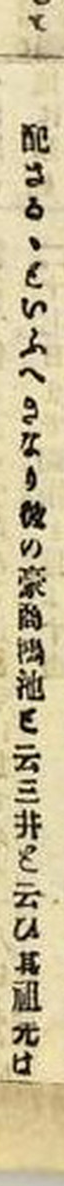配さるゝといふへきなり彼の豪商鴻池と云三井と云ひ其祖先は
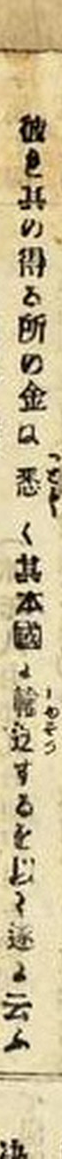彼れ其の得る所の金は悉く其本国に輸送するを以て遂に云ふ
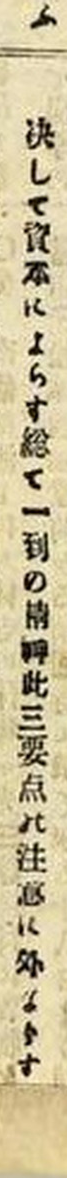決して資本によらす総て一到の精神此三要点の注意に外ならす
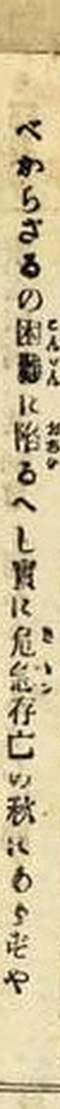べからざるの困難に陥るへし実に危急存亡の秋にあらずや
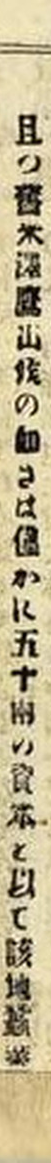且つ旧米澤鷹山侯の如きは僅かに五十両の資本を以て該地蚕業
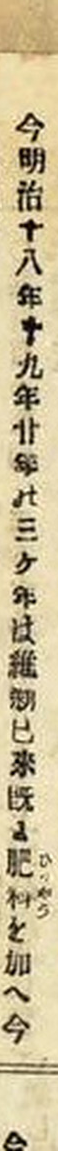今明治十八年十九年廿年の三ケ年は維新已来既に肥料を加へ今
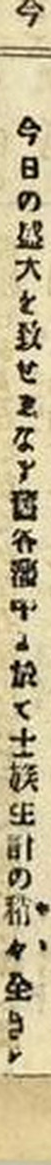今日の盛大を致せしなり旧各藩中に於て士族生計の稍々全きを
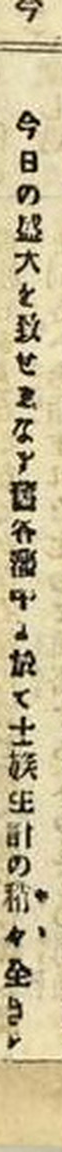今日の盛大を致せしなり旧各藩中に於て士族生計の稍々全きを
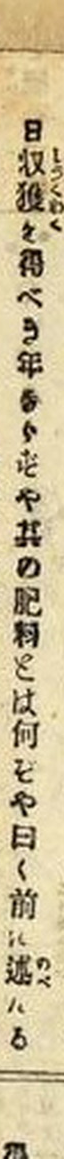日収獲を得べき年ならずや其の肥料とは何ぞや曰く前に述たる
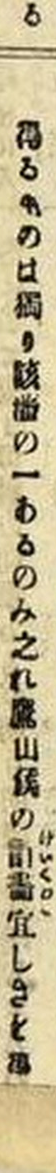得るものは独り該藩の一あるのみ之れ鷹山侯の計画宜しきを得
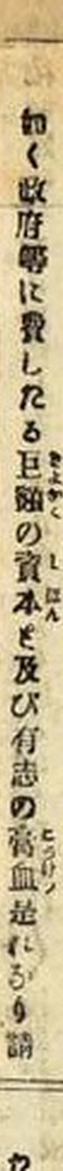如く政府等に費したる巨額の資本と及び有志の膏血是れなり請
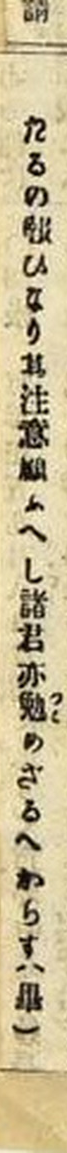たるの報ひなり其注意願ふへし諸君亦勉めざるへからす畢
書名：温古集 五巻
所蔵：福井県文書館 Fukui Prefectural Archives
